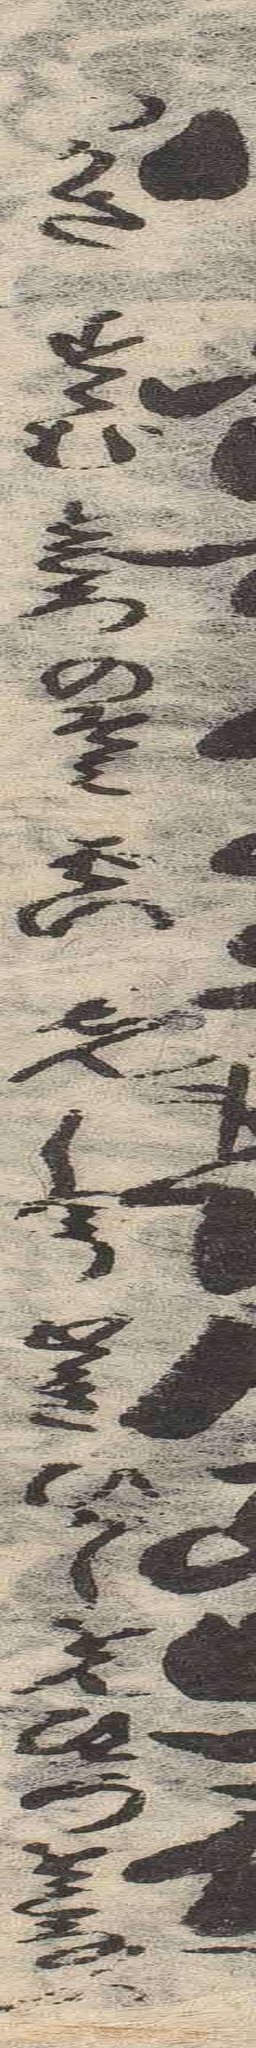つかさすゝむところのそみはいしんしやうせきひかしをんひとつをこなふ
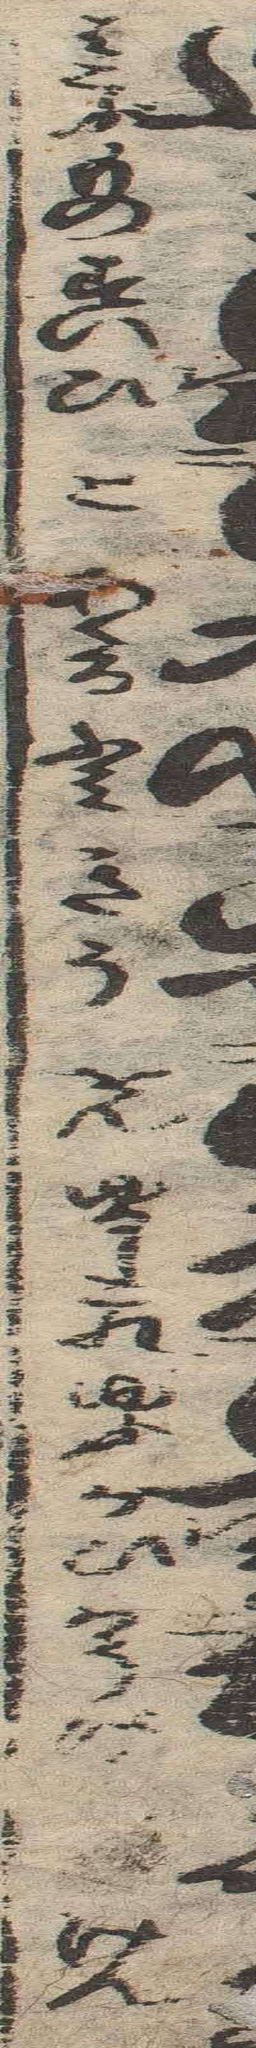はこぶものすいひこあくるふみきうをんゆるしこれゆふかひかうげけん

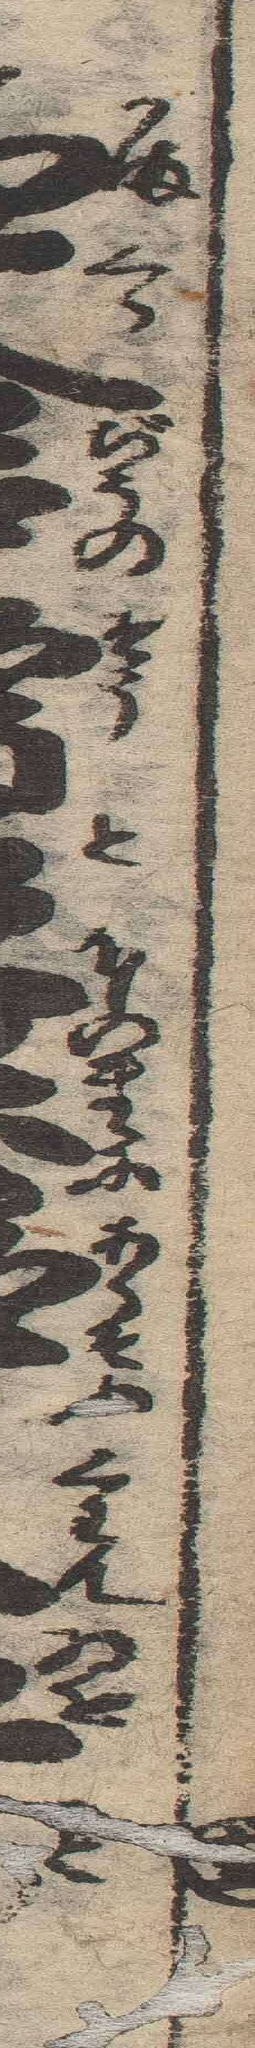かまくらぢうのそうとほしいまゝにあらそふくわんゐをこと
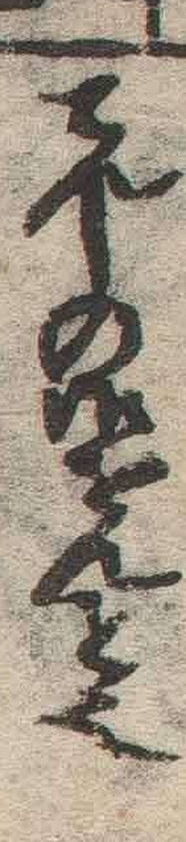朝恩てんしの御をんと也
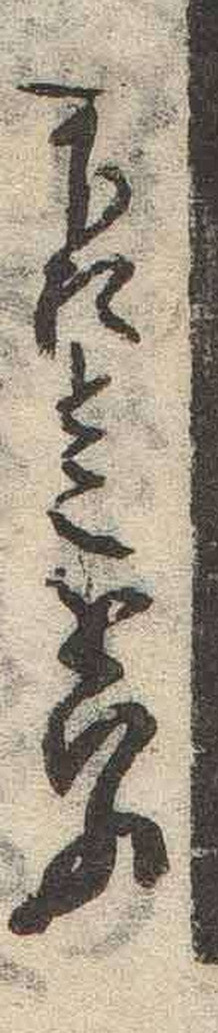奴下おとこをいふ
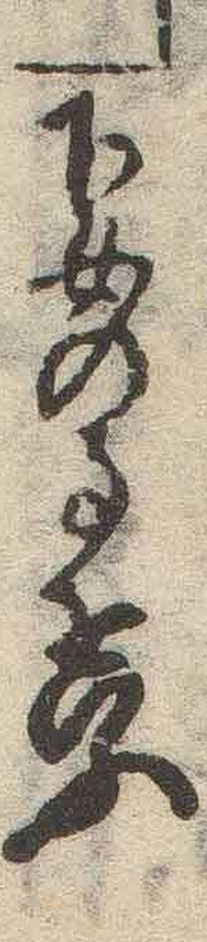婢下女の事をいふ
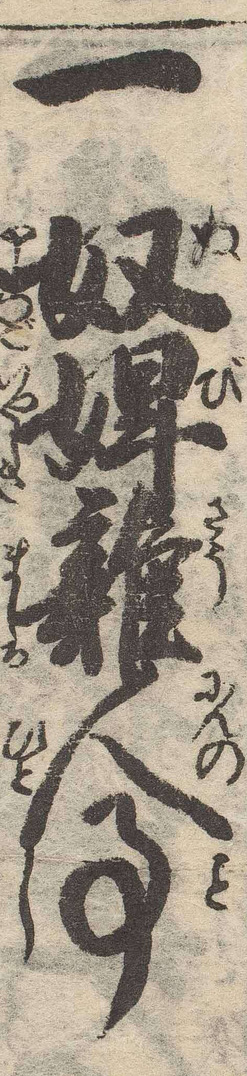一奴婢雑人事
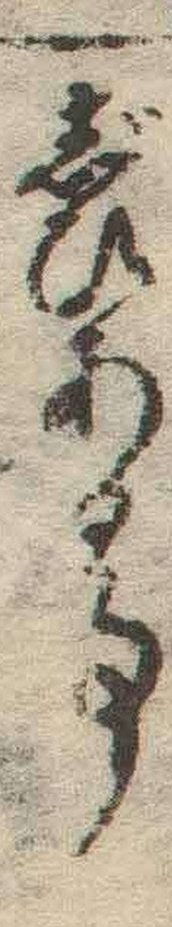仁政じひある事
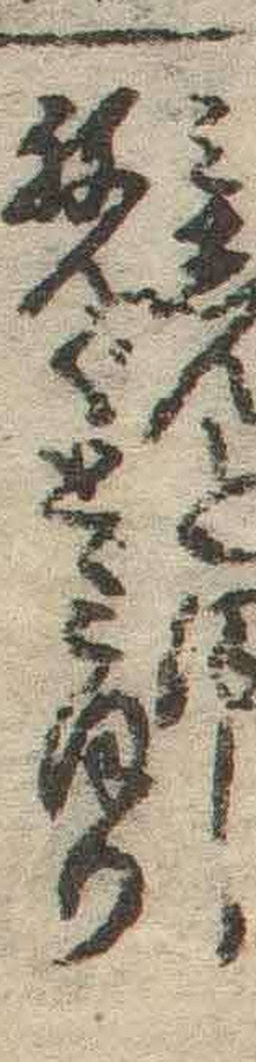ねんぐとゝこほり
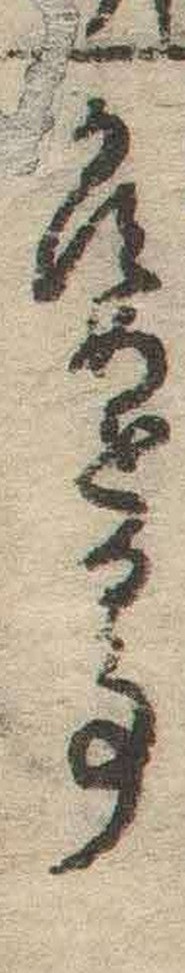押領かすめとる事

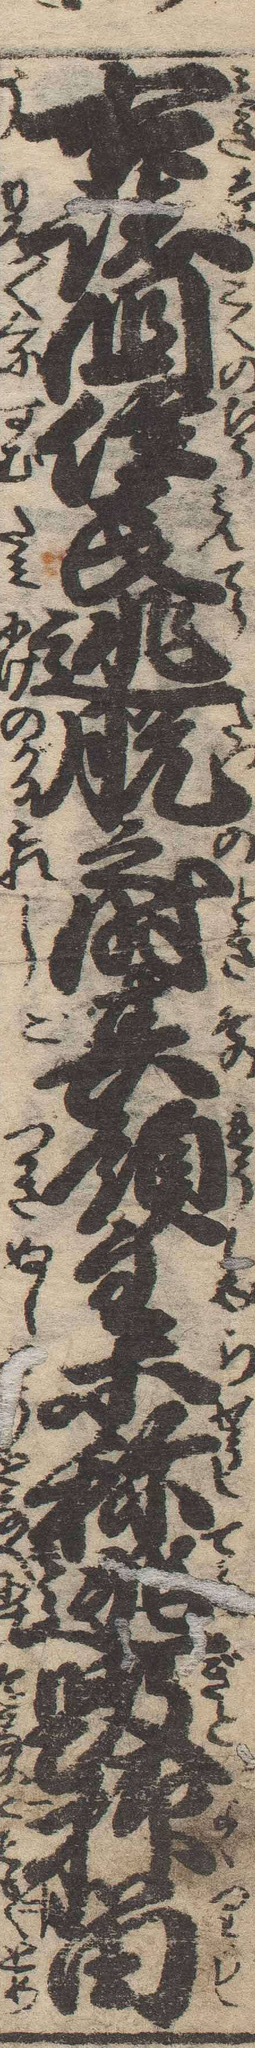右諸国住民逃脱之時其領主等称逃毀抑-留
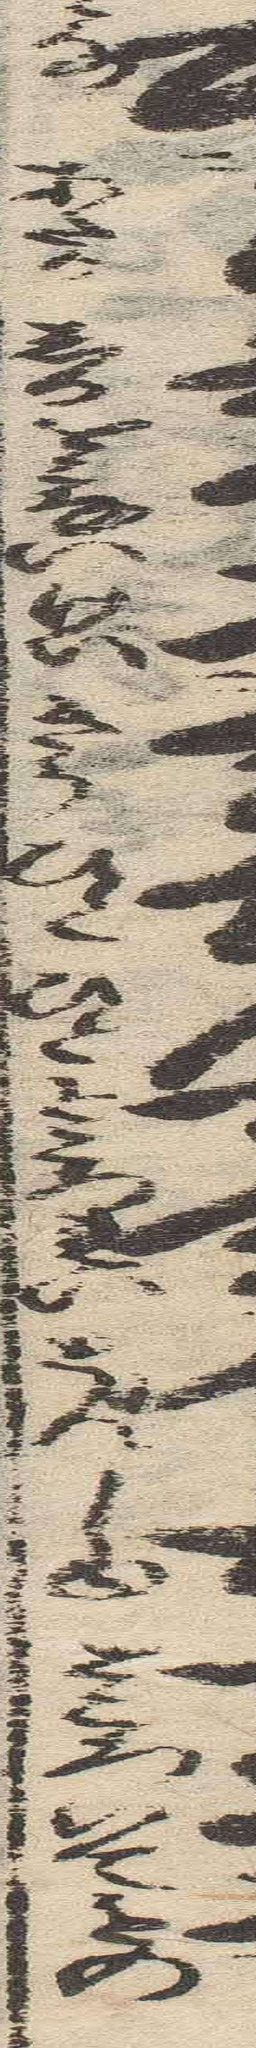となうあたるしるをこないけいきうひとひとところれいどんしゆところいてもの
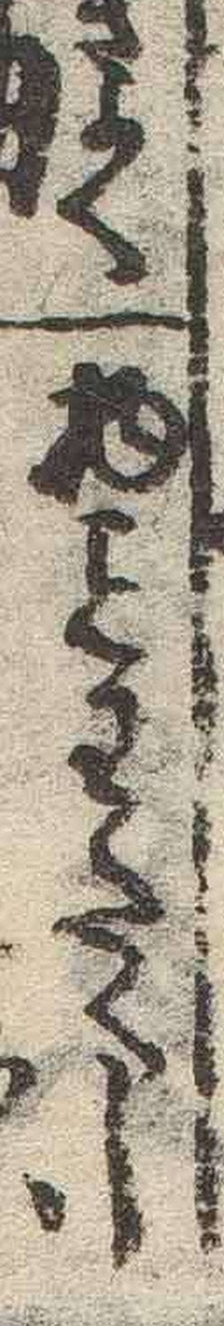私曲物ことわたくし
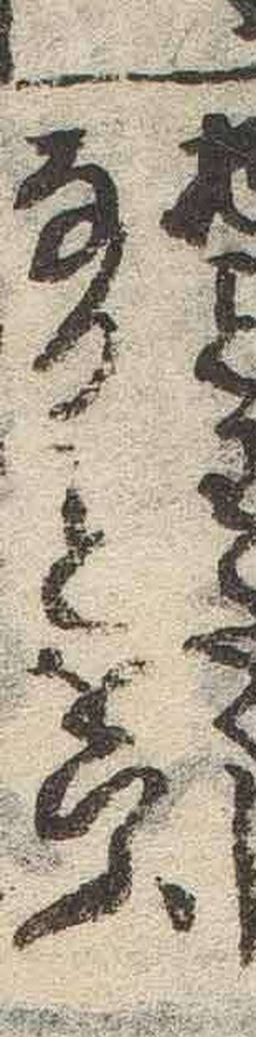なることをいふ
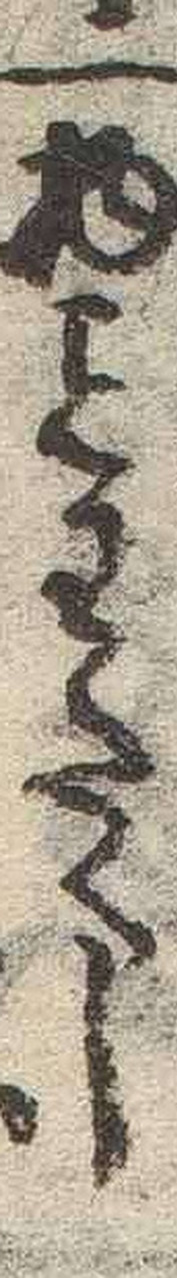私曲物ことわたくし
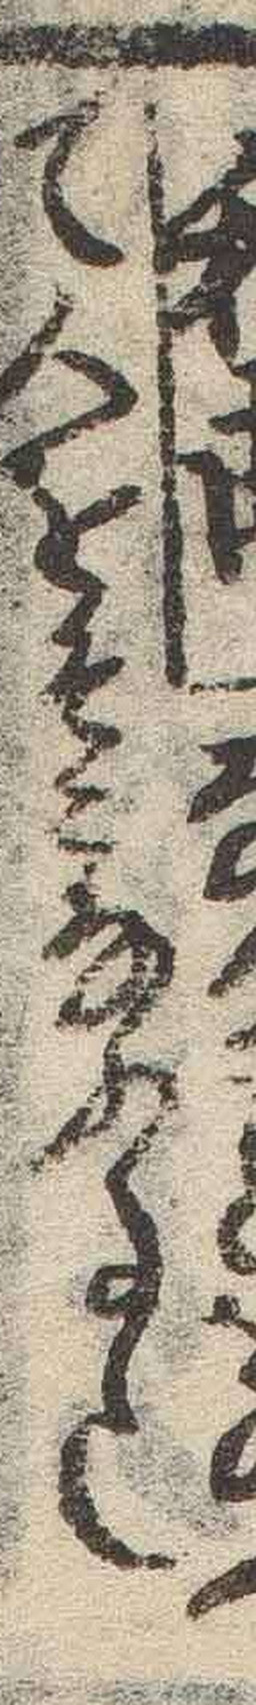て人をそこなふ事也
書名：御成敗式目絵抄
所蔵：東京学芸大学附属図書館 国文学研究資料館
